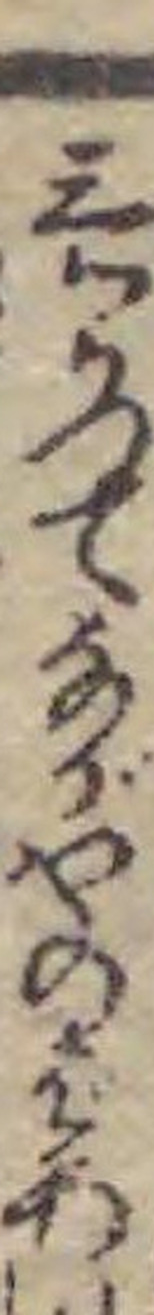三ツかつてながやのばあ
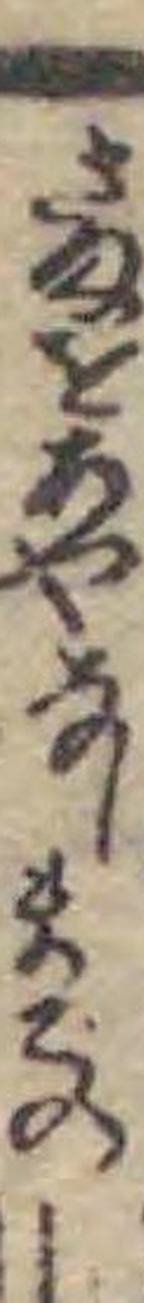さまをあやなしまごの
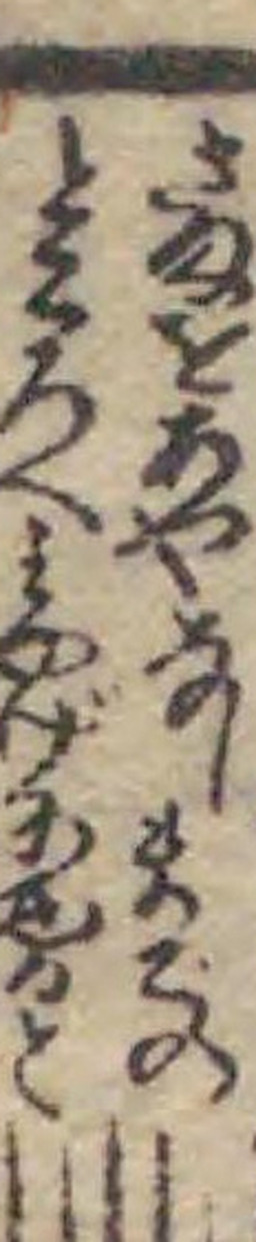ところへみやげにやると
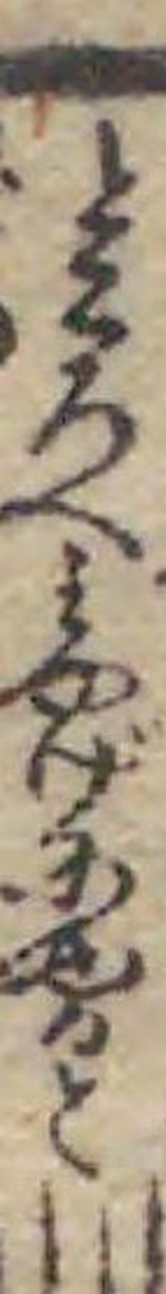ところへみやげにやると
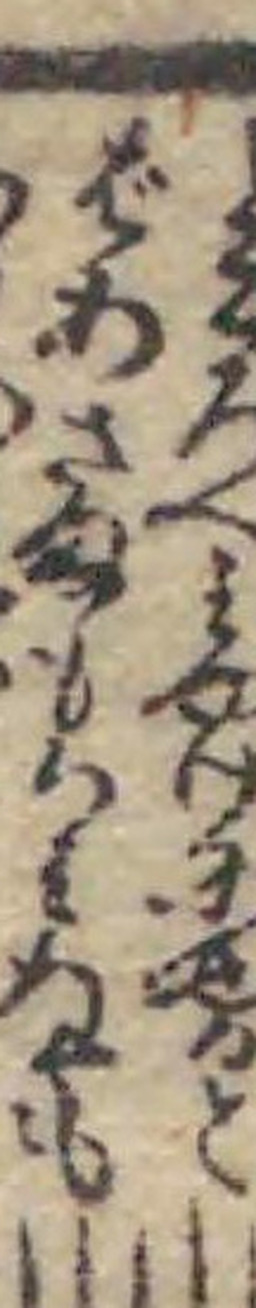ばあさまもかみ様も
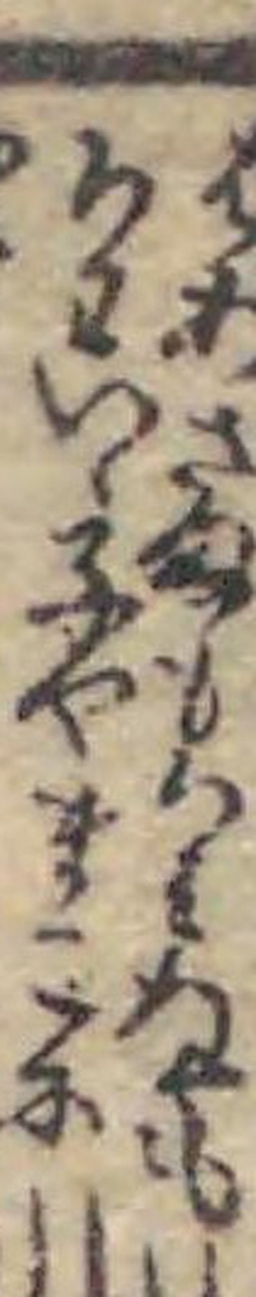かわいゝ子やまこに
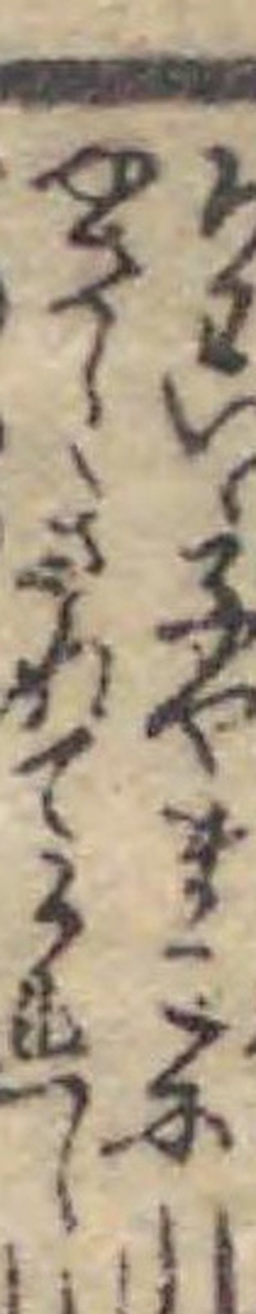やさしくされてうれし
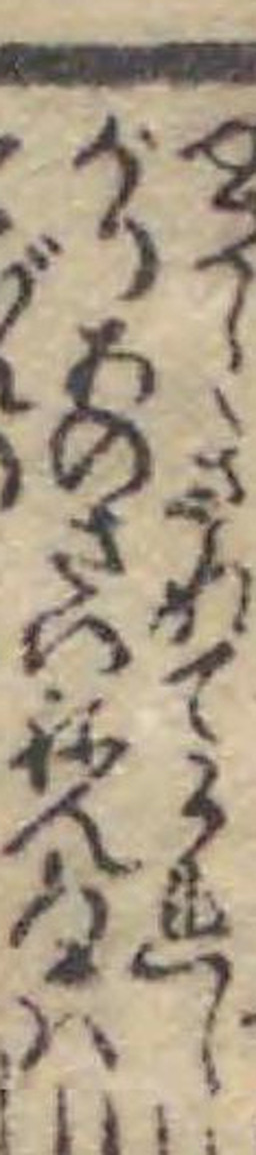がりあのさいねん様は
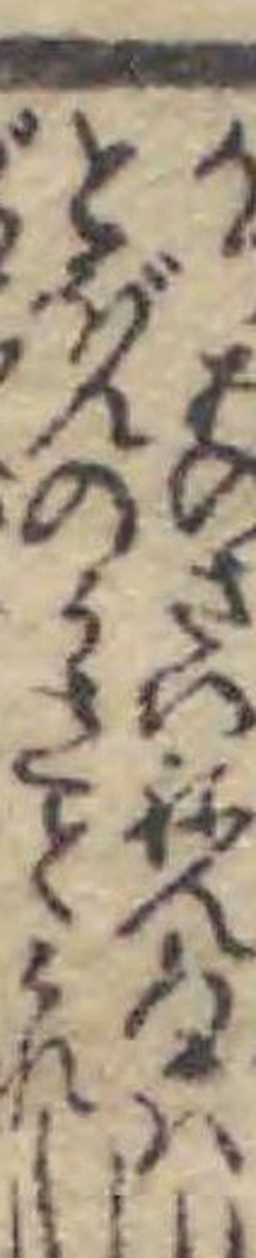こぼんのうさとうれし
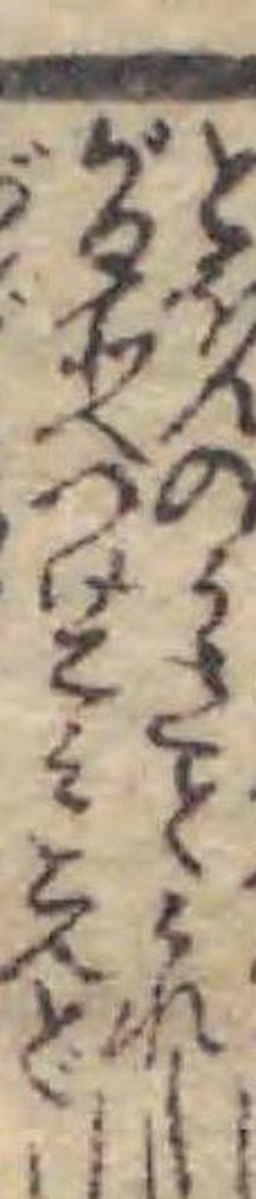がる所へつけこみこんど
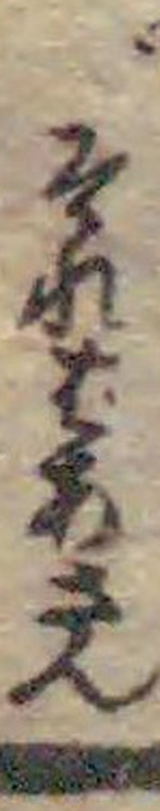そればあさん
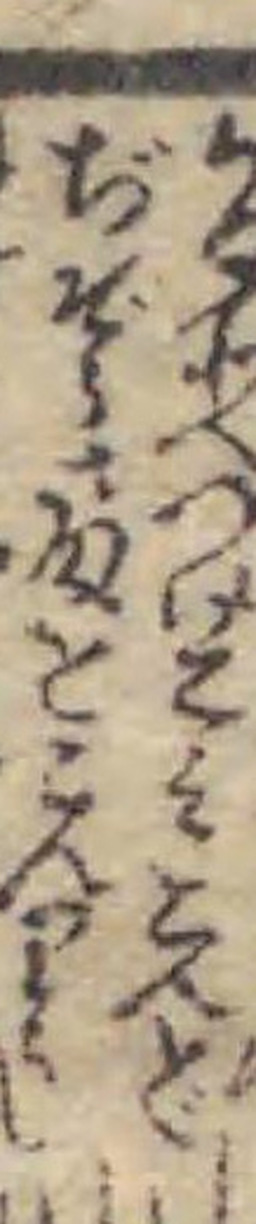ぢぞうさまをこんりうし
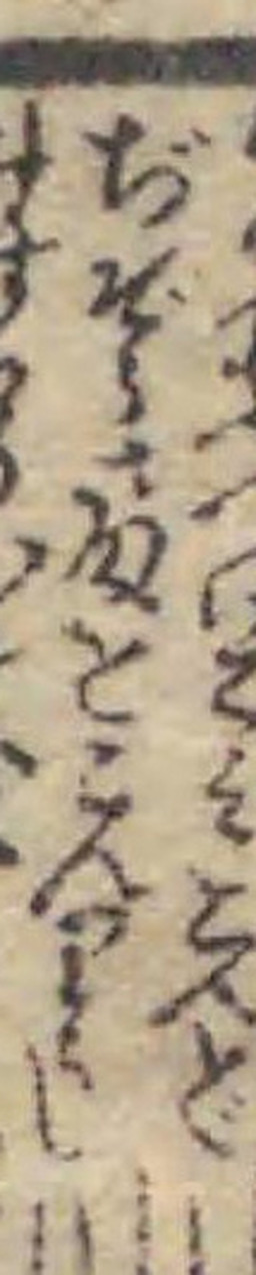ぢぞうさまをこんりうし
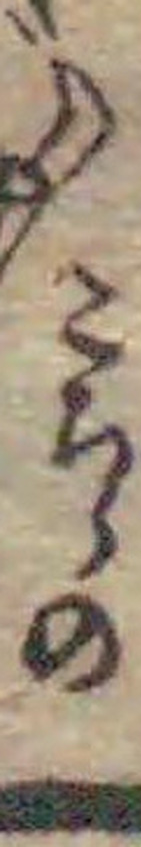こちらの
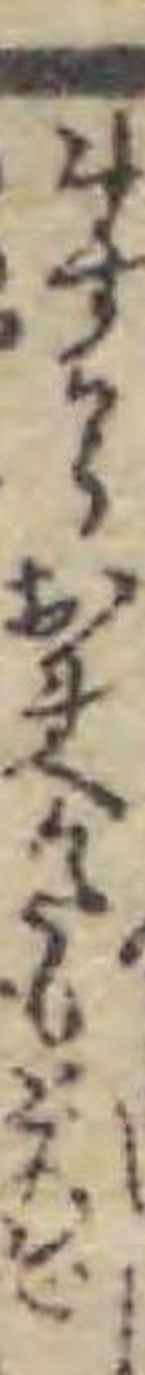ますからおまへかたもどふぞ
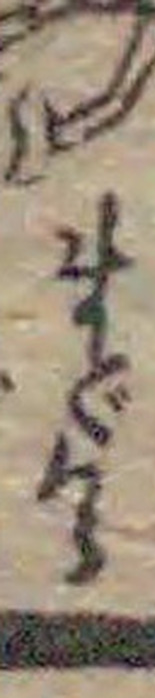まどから
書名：紙屑身上噺 : 3巻
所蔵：国立国会図書館 National Diet Library, JAPAN
